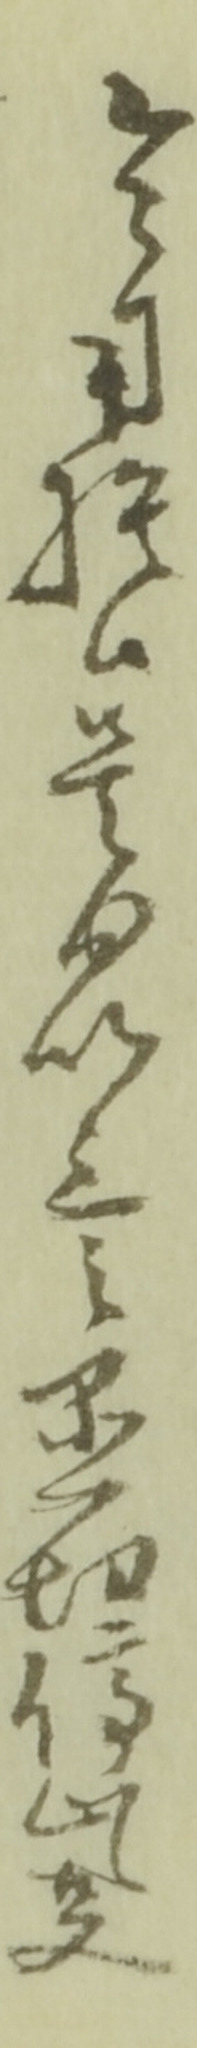令用捨候之より以上之品一切停止候事
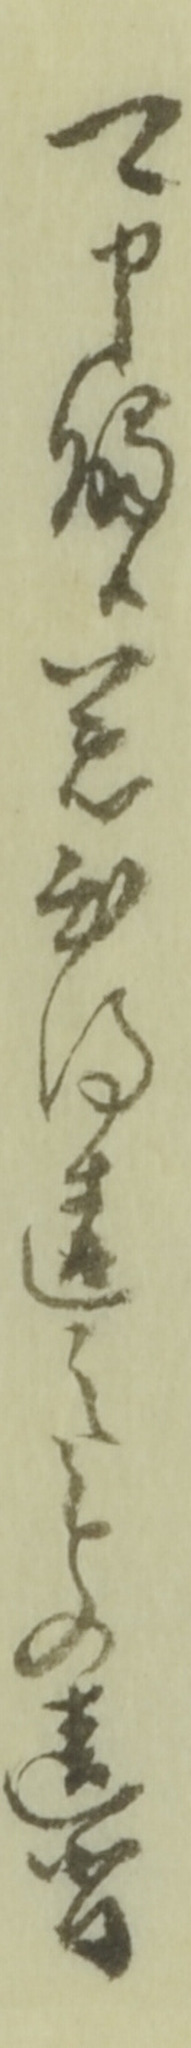可申触候兼心得違之もの違背
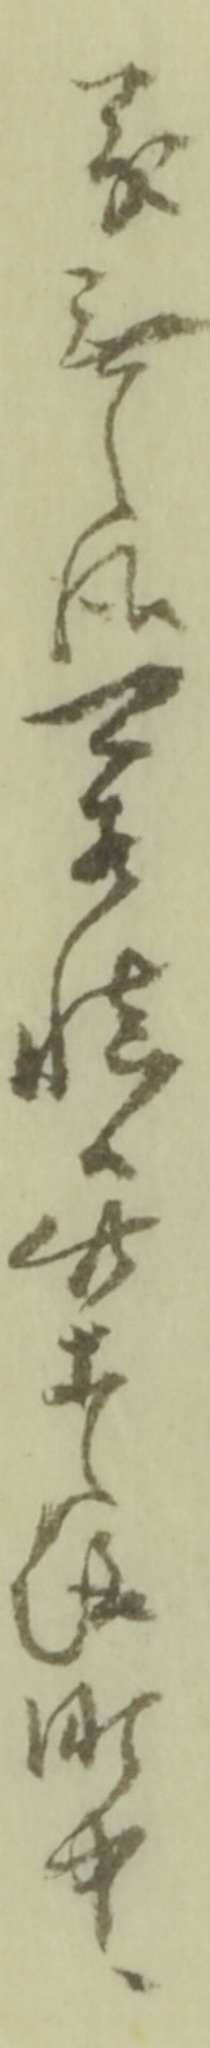義無之様可相慎候此等之趣町中へ
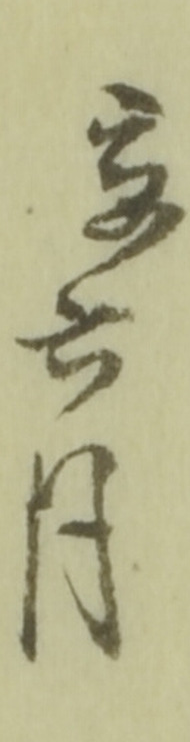亥六月
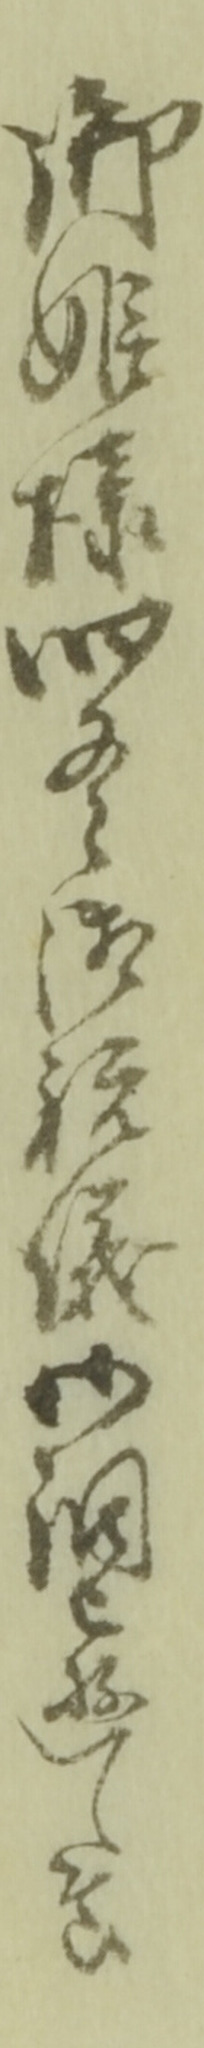御姫様作冬御祝儀御調被遊候節
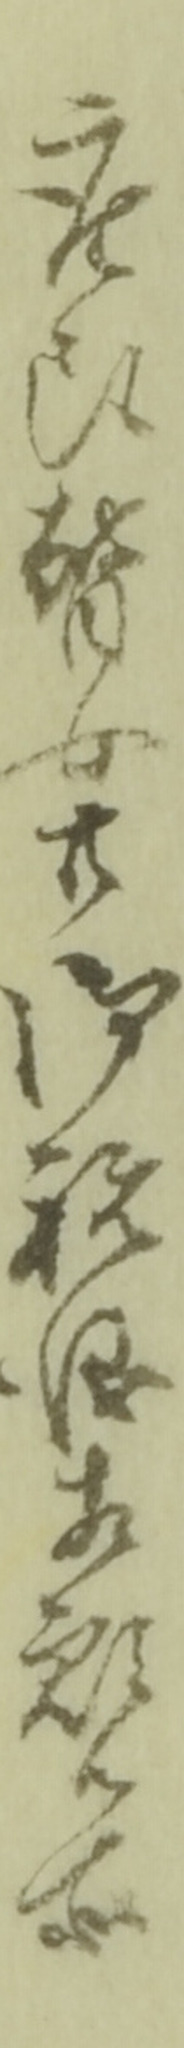座頭瞽女共御祝儀相願候處
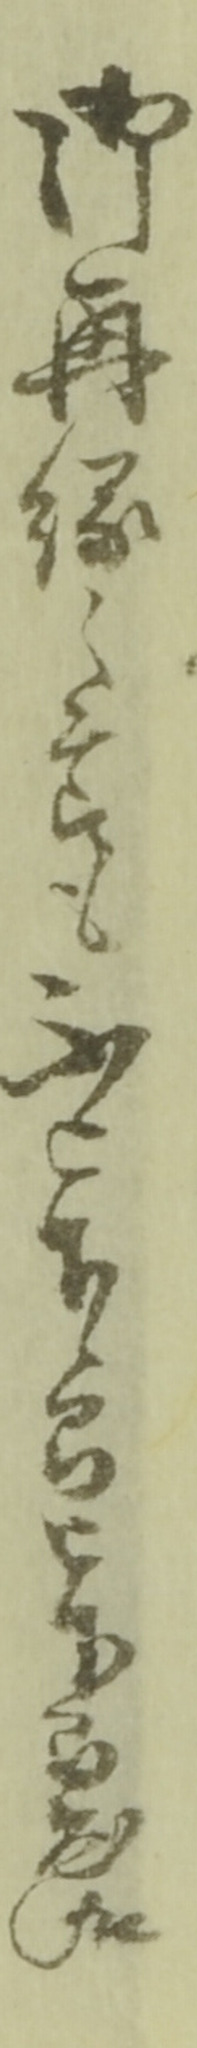御再縁之節も不被下候間被下間敷
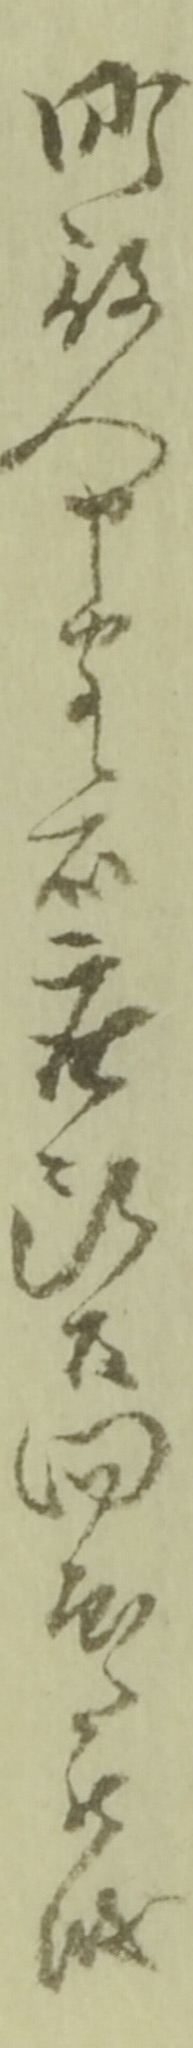町役人申聞候所座頭問屋へ罷成
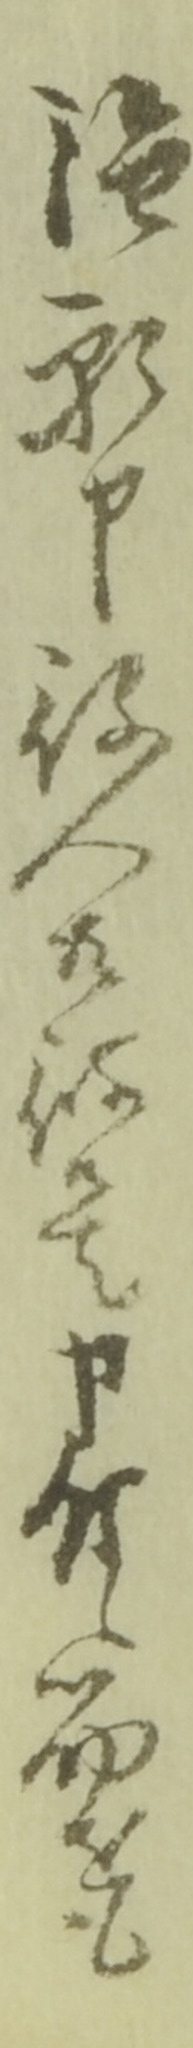滝頼申役人共彼是申付候筋をも

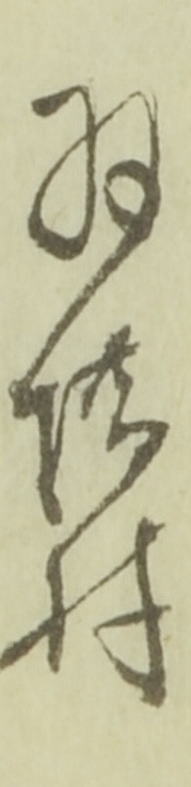羽橋村
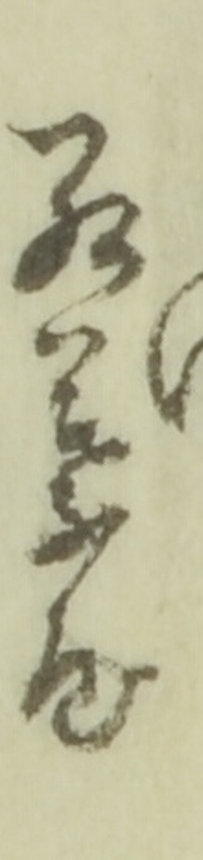若葉屋
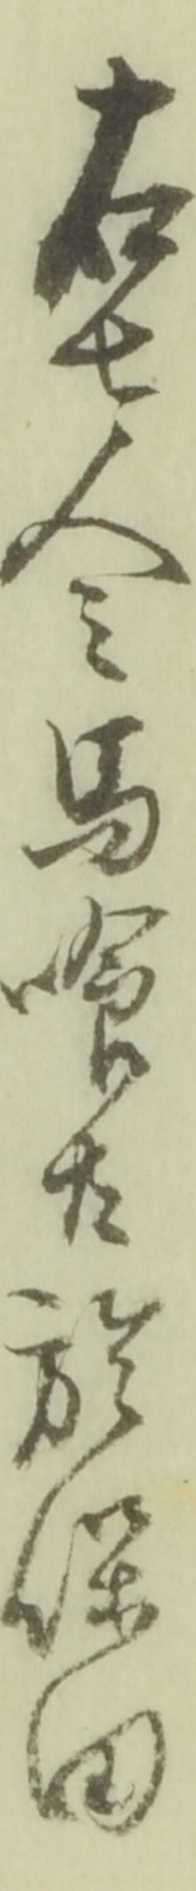右七人之馬喰共於保田
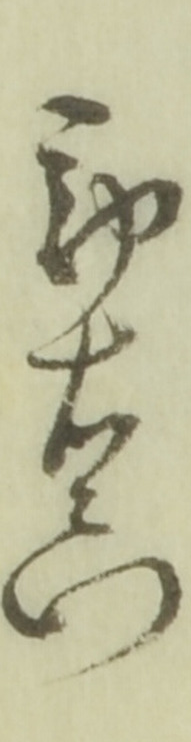勘右衛門
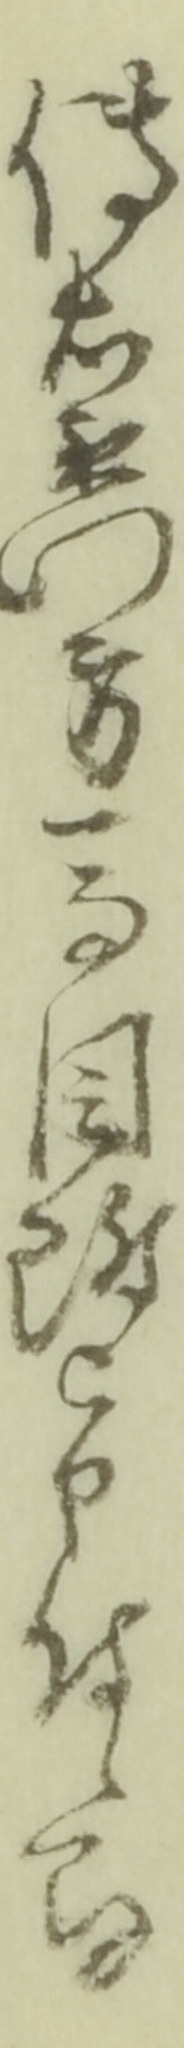伝右衛門方馬目附被申候間
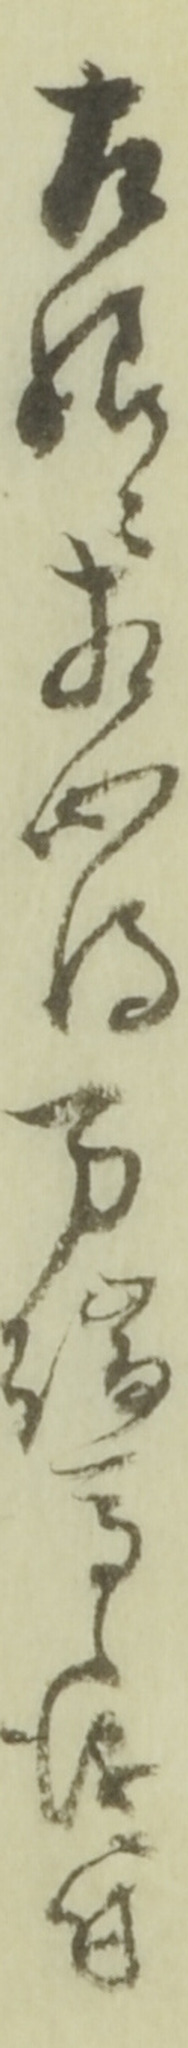左様二相心得万端馬候儀二付
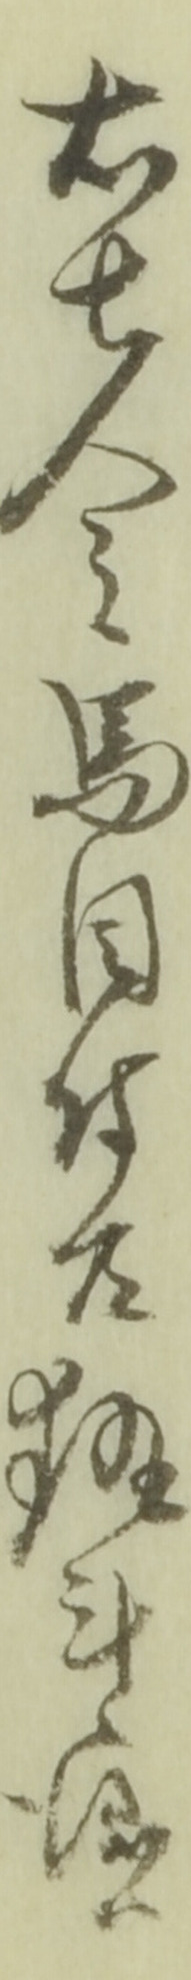右七人之馬目付共猶斗候様二
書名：御公儀様御領主様御触書控
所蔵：伊那市立高遠町図書館・合同会社AMANE
